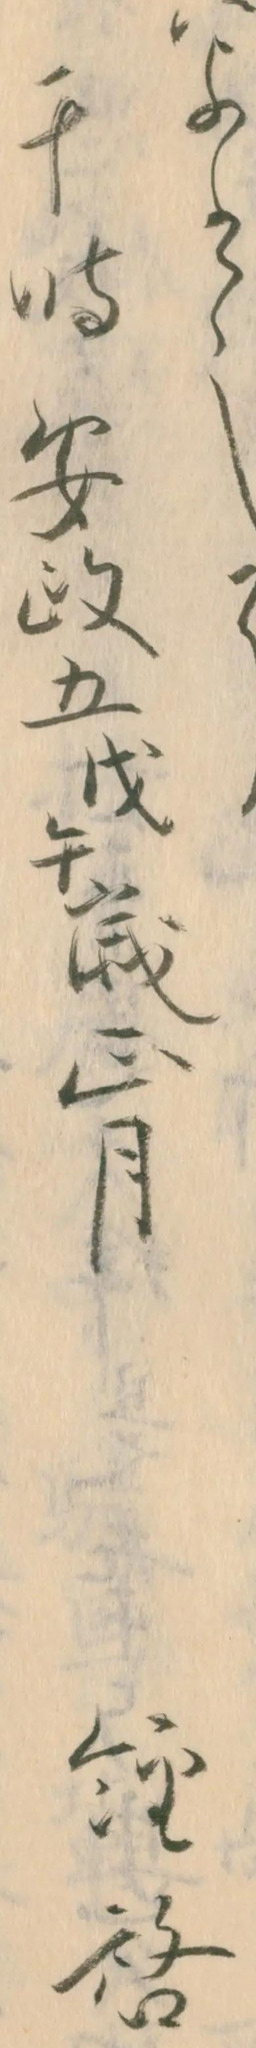于時安政五戊午歳正月経啓

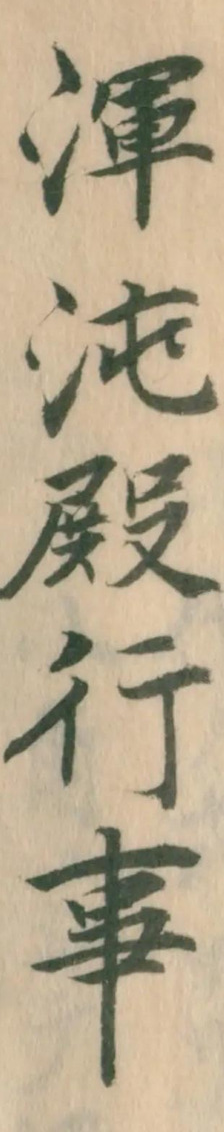渾沌殿行事

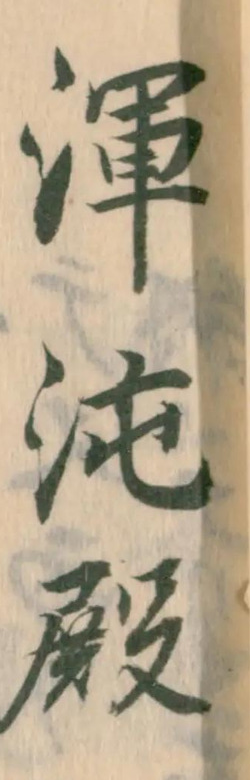渾沌殿

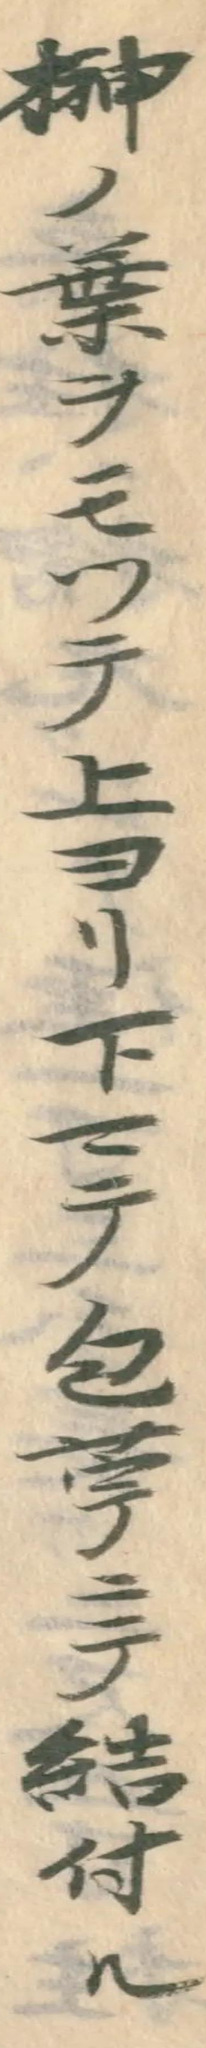榊ノ葉ヲモツテ上ヨリ下マテ包苧ニテ結付ル
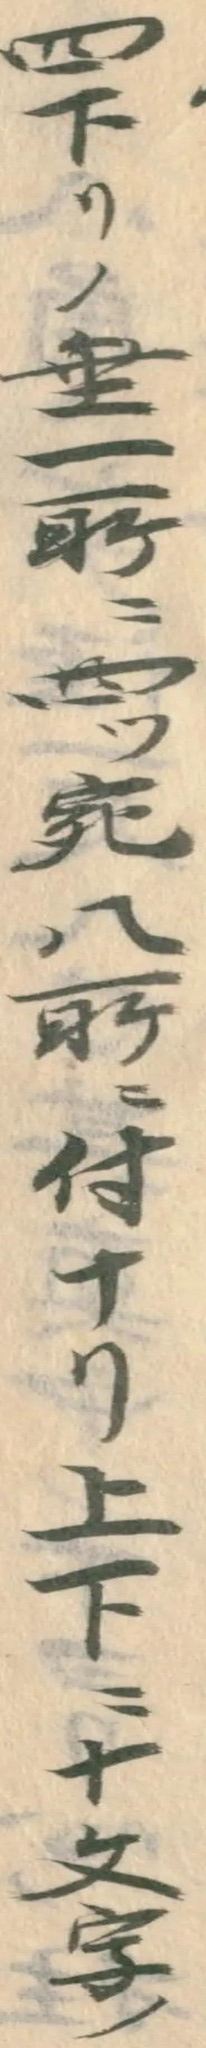四下リノ垂一所ニ四ツ宛八所ニ付ナリ上下ニ十文字ノ
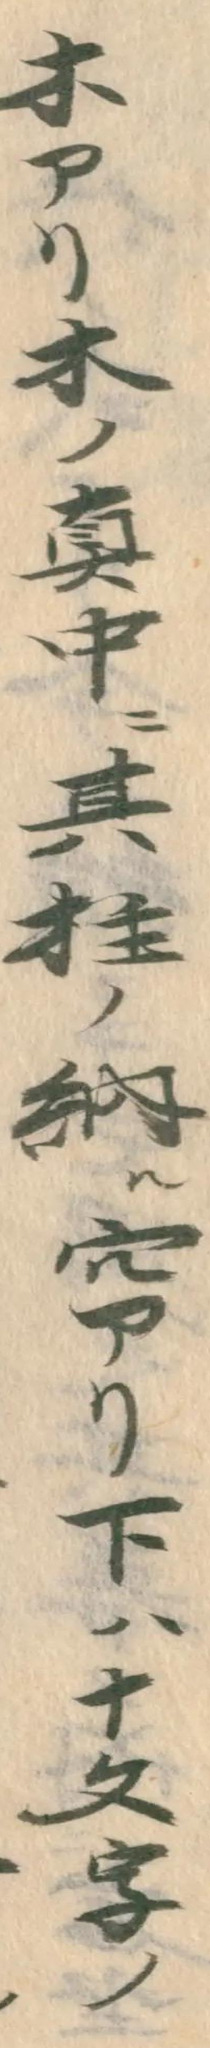木アリ木ノ真中ニ其柱ノ納ル穴アリ下ハ十文字ノ
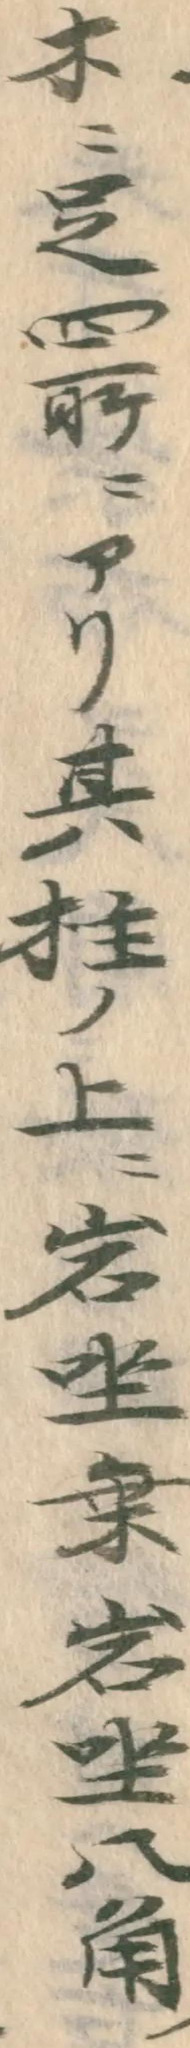木ニ足四所ニアリ其柱ノ上ニ岩坐乗岩坐八角ノ
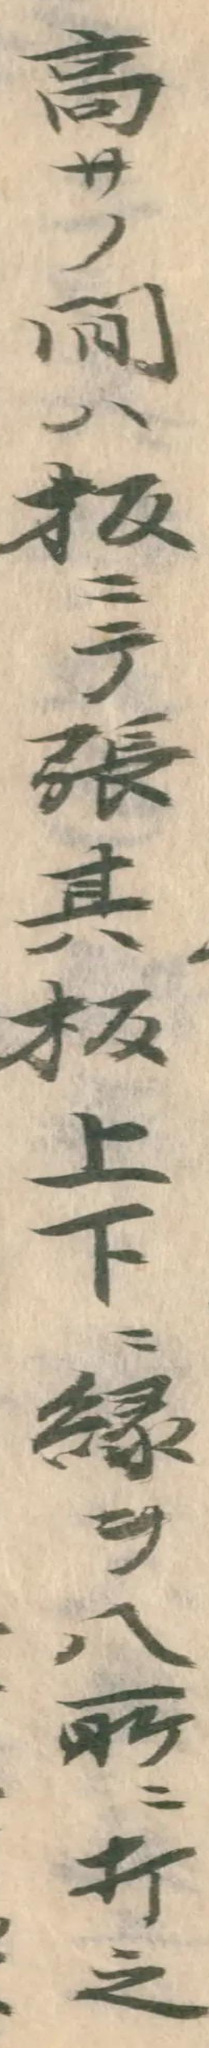高サノ間ハ板ニテ張其板上下ニ縁ヲ八所ニ打之
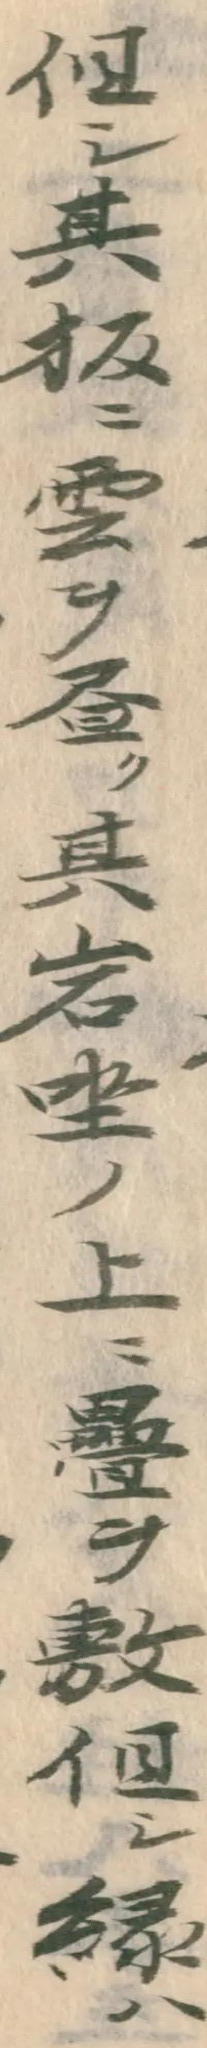但シ其板ニ雲ヲ画ク其岩坐ノ上ニ畳ヲ敷但シ縁ハ
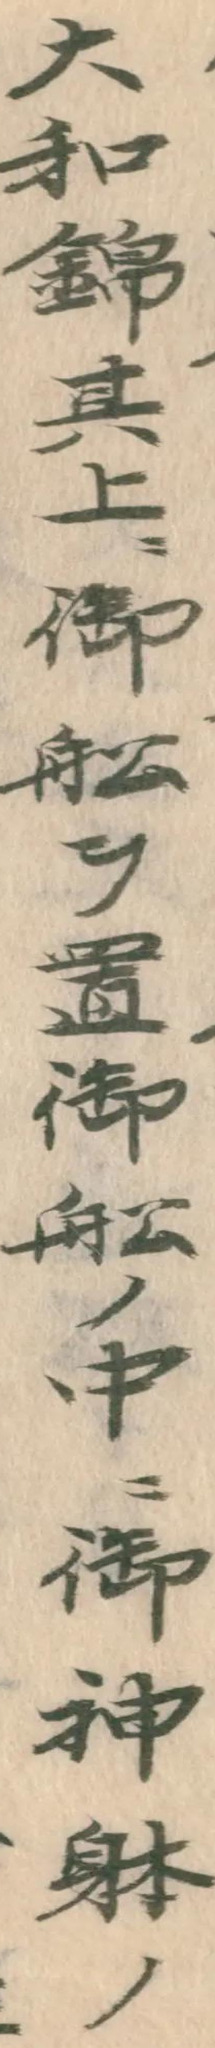大和錦其上ニ御船ヲ置御船ノ中ニ御神体ノ
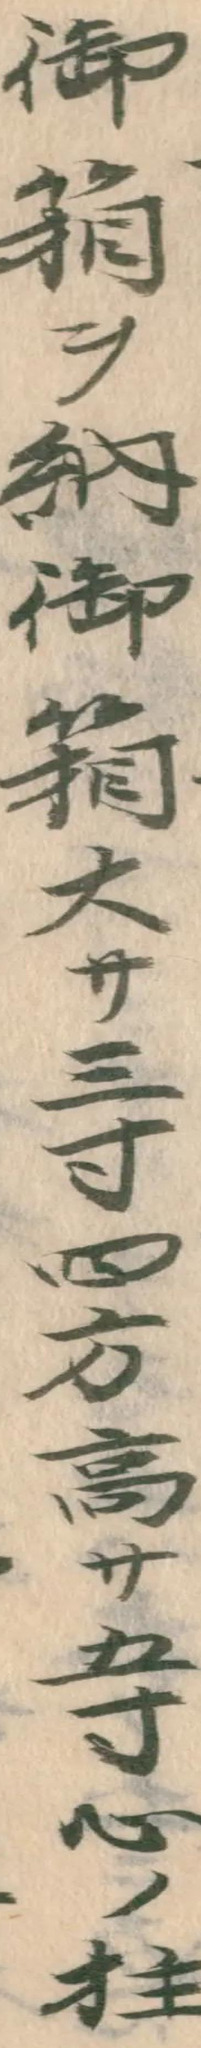御箱ヲ納御箱大サ三寸四方高サ五寸心ノ柱
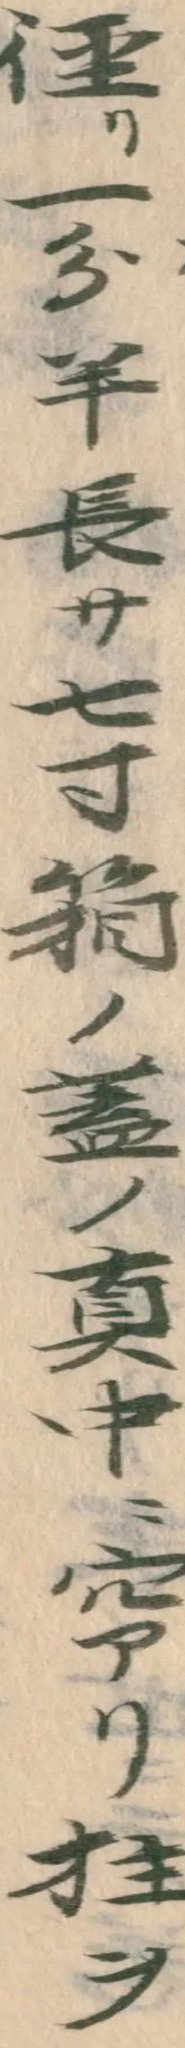径リ一分半長サ七寸箱ノ蓋ノ真中ニ穴アリ柱ヲ
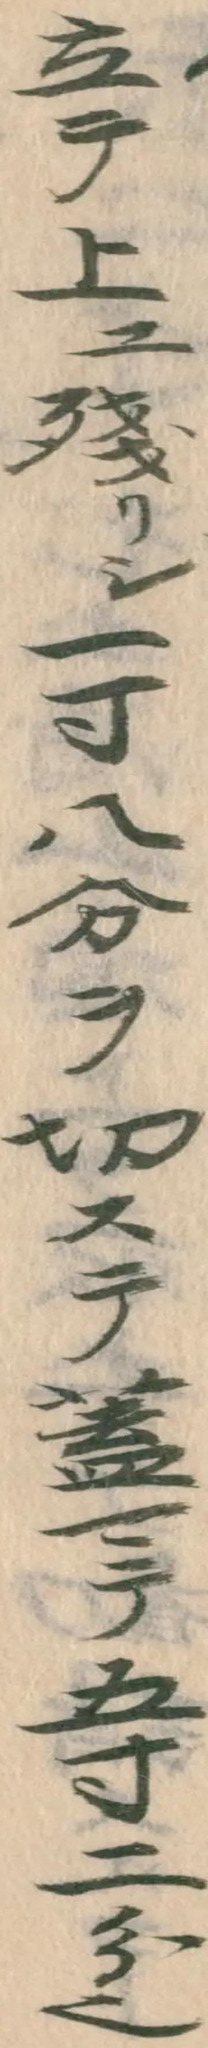立テ上ヱ残リシ一寸八分ヲ切ステ蓋マテ五寸二分也
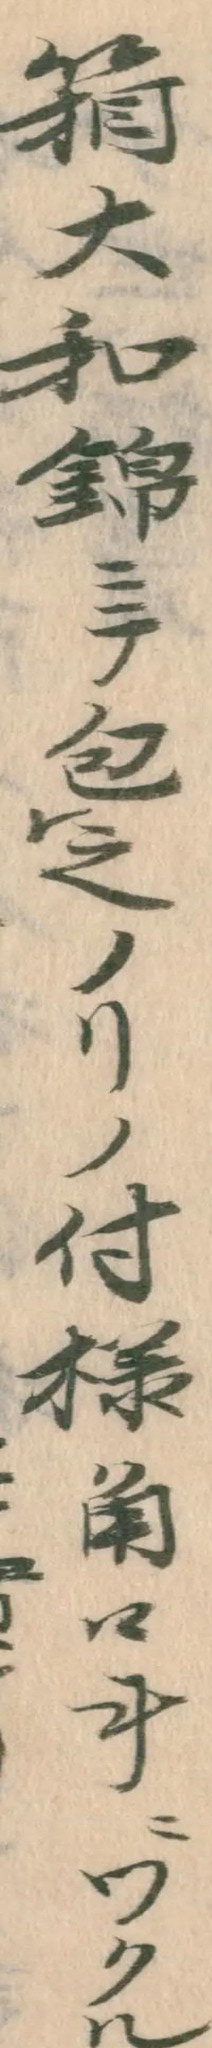箱大和錦ニテ包之ノリノ付様角口斗ニツクル
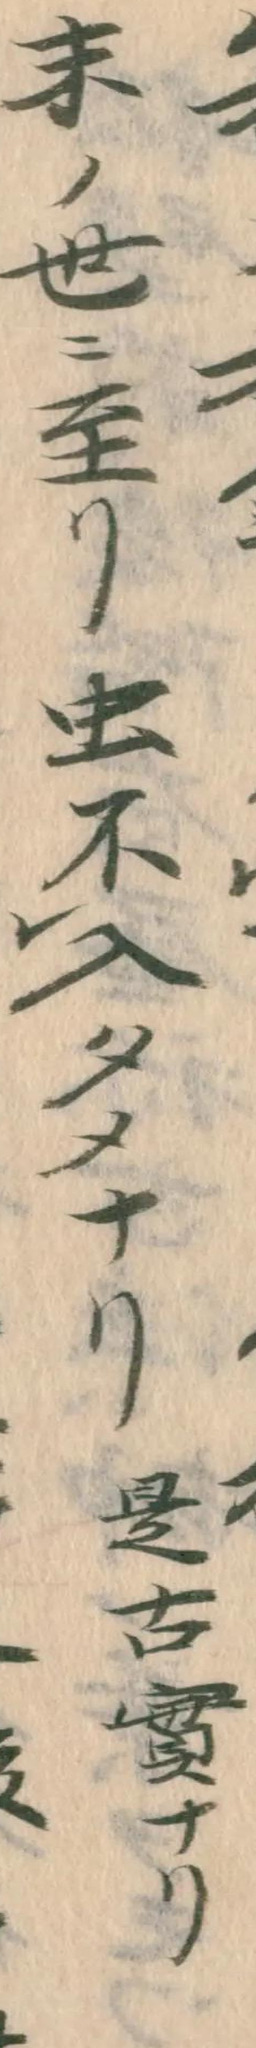末ノ世ニ至リ虫不入タメナリ是古実ナリ
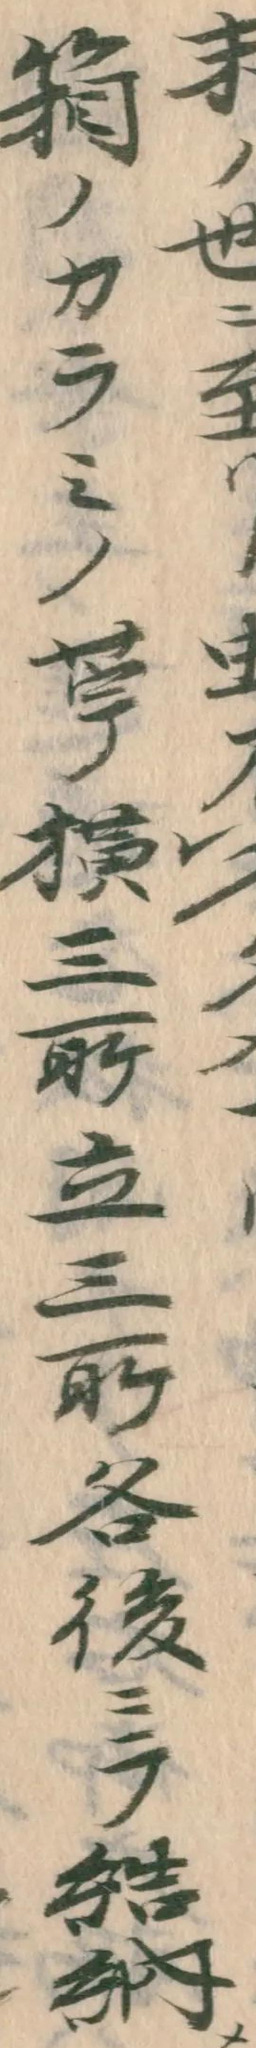箱ノカラミノ苧横三所立三所各後ニテ結納メ
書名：賀茂社記録. 第91冊
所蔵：国立国会図書館 National Diet Library, JAPAN
